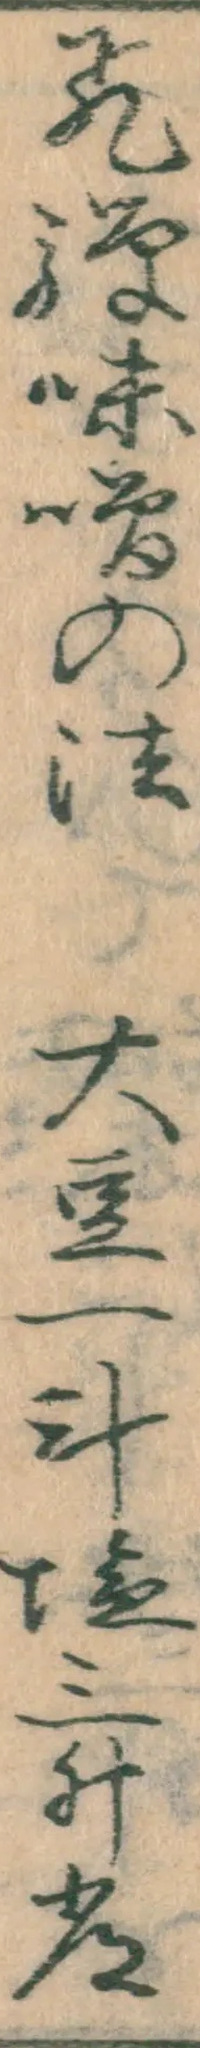飛騨味噌の法大豆一斗塩三升常
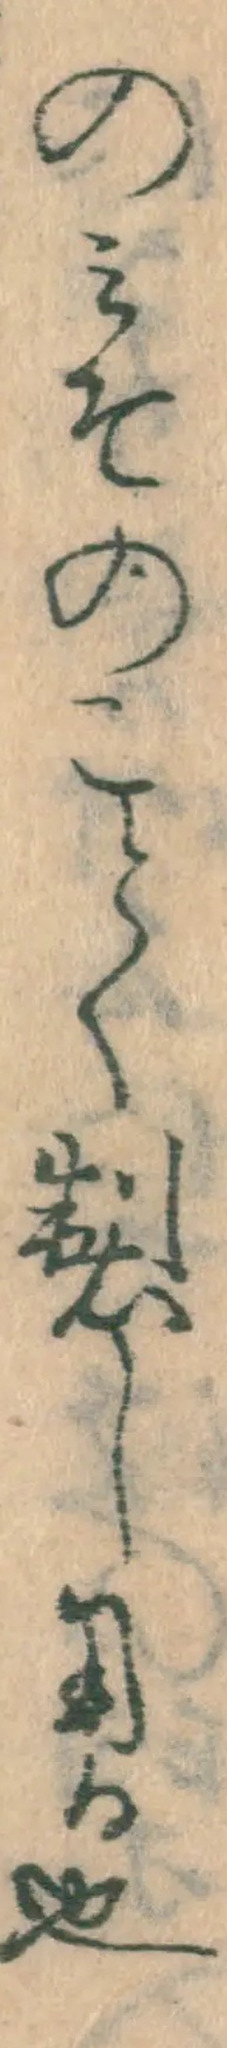のみそのことく製し用る也
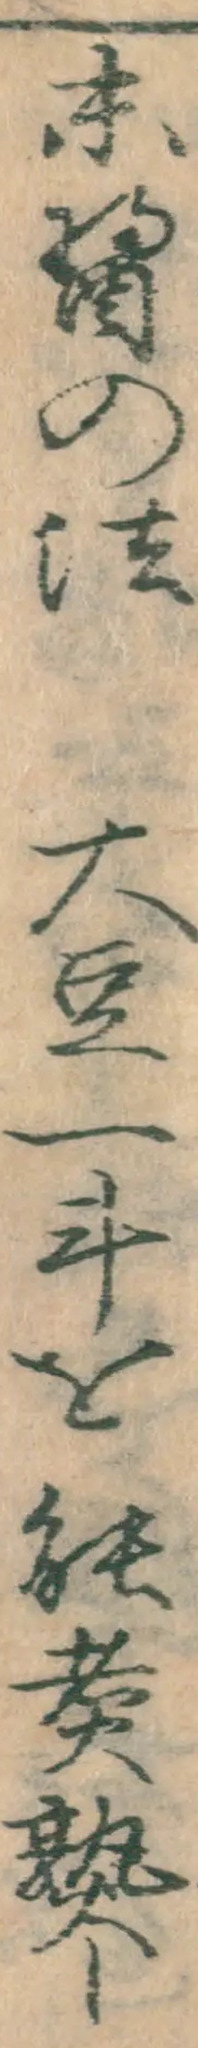末醤の法大豆一斗を能煮熟し

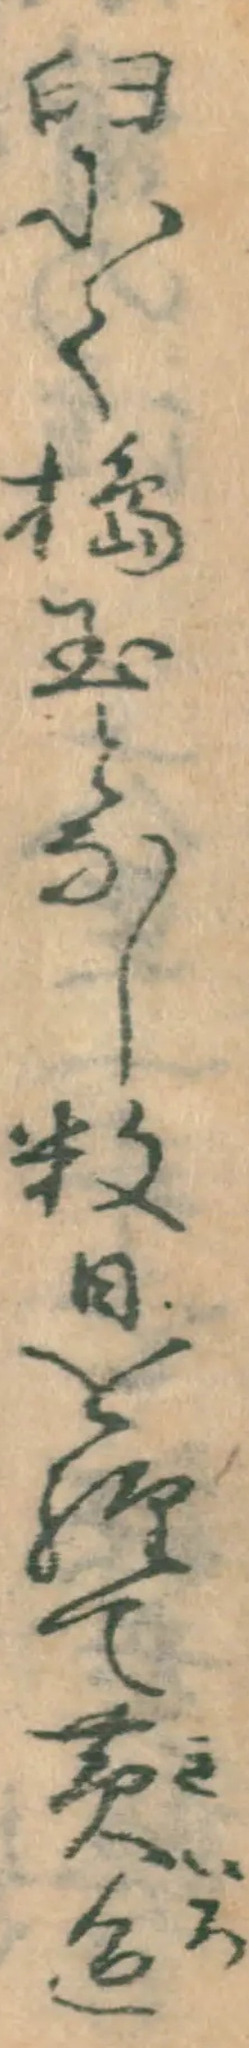臼にて搗玉となし数日を経て黄色
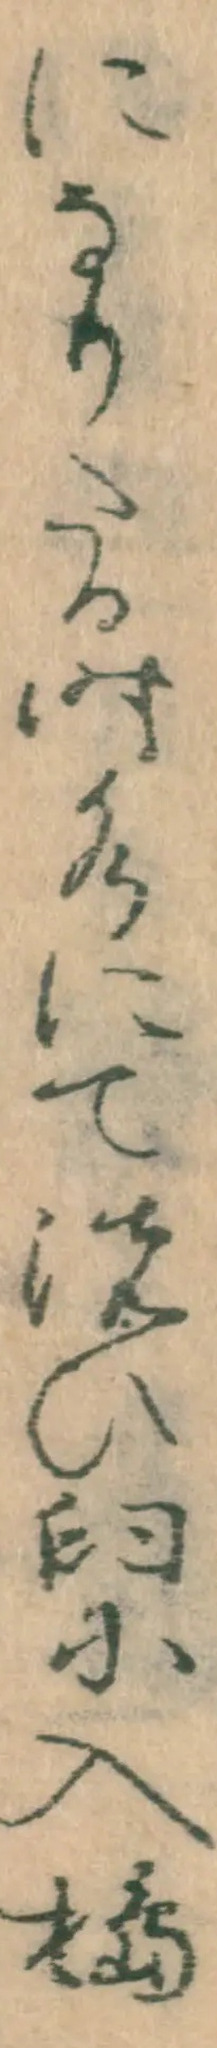になりたる時水にて洗ひ臼に入搗
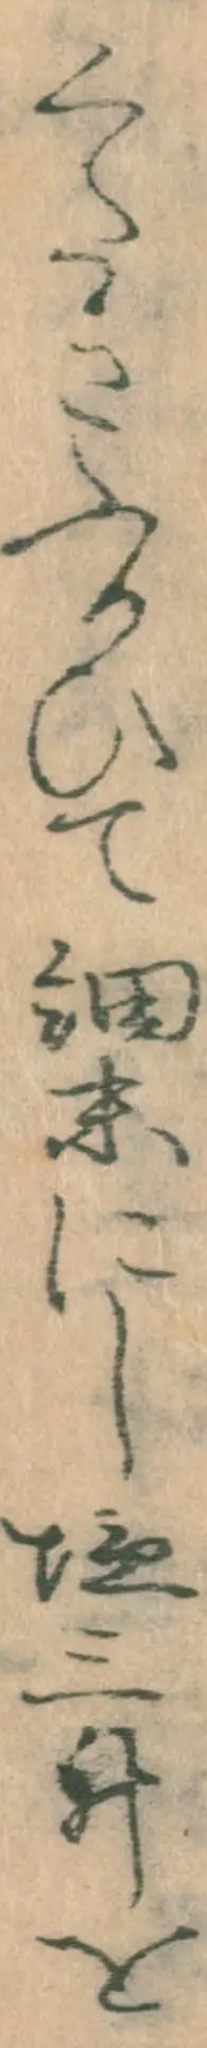くたきふるひて細末にし塩三升を
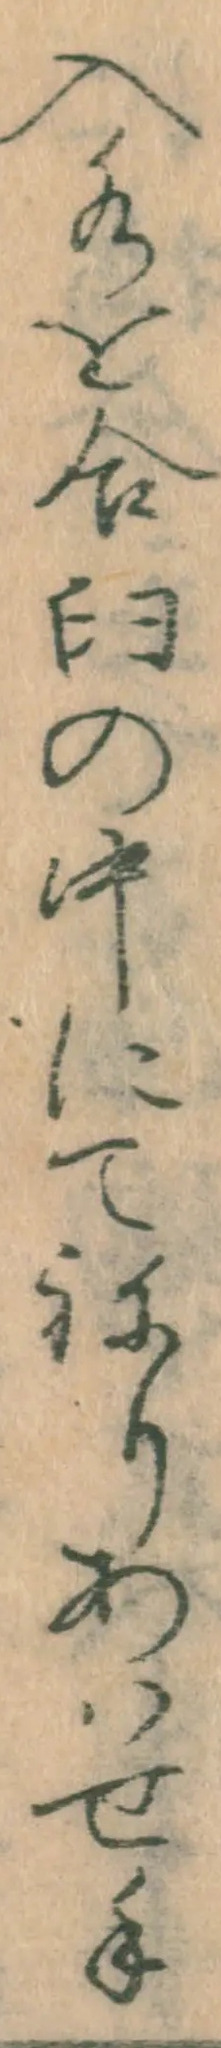入水を合臼の中にてねりあはせ手
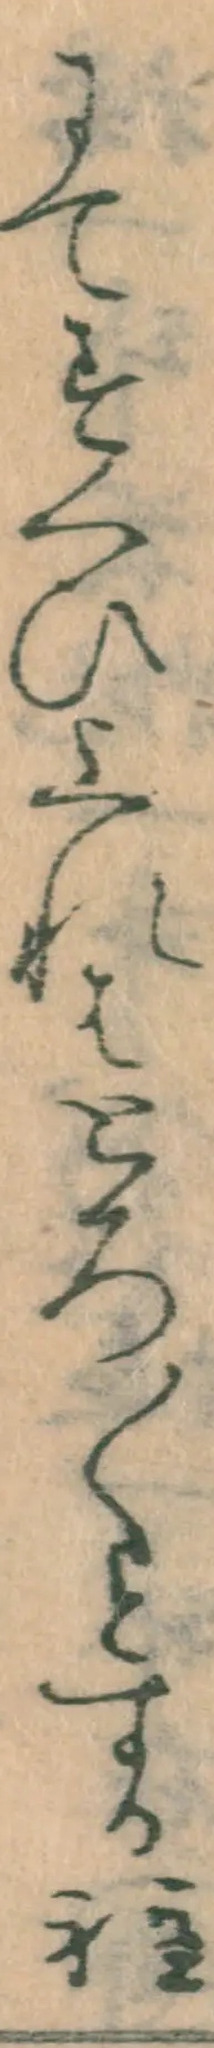にてすくひ上れはとろ〳〵とする程
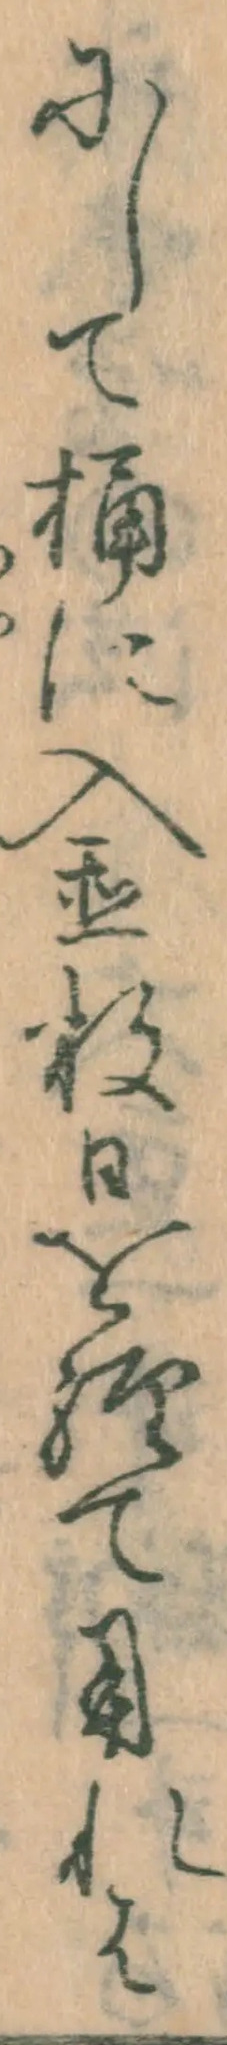にして桶に入置数日を経て用れは
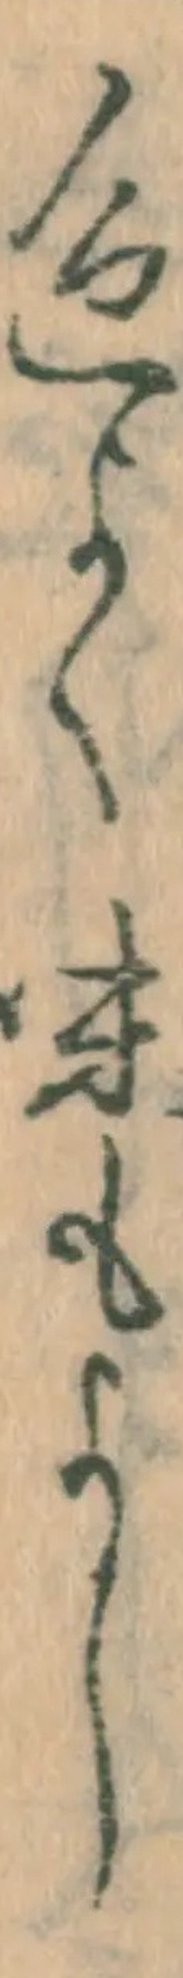色よく味もよし
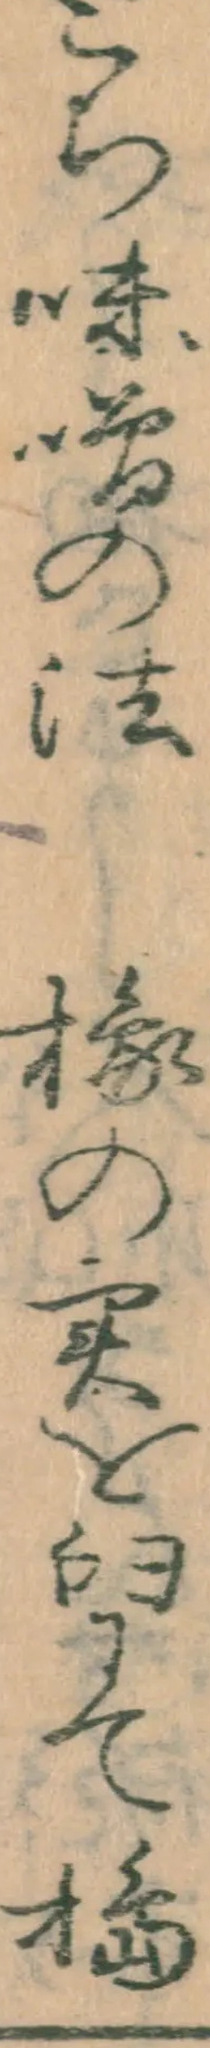とち味噌の法橡の実を臼にて搗
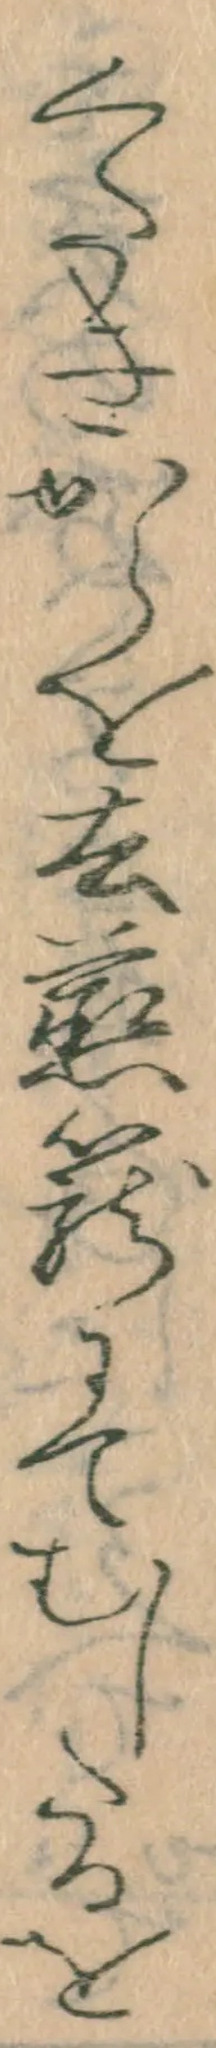くたきからを去蒸篭にてむしたるを
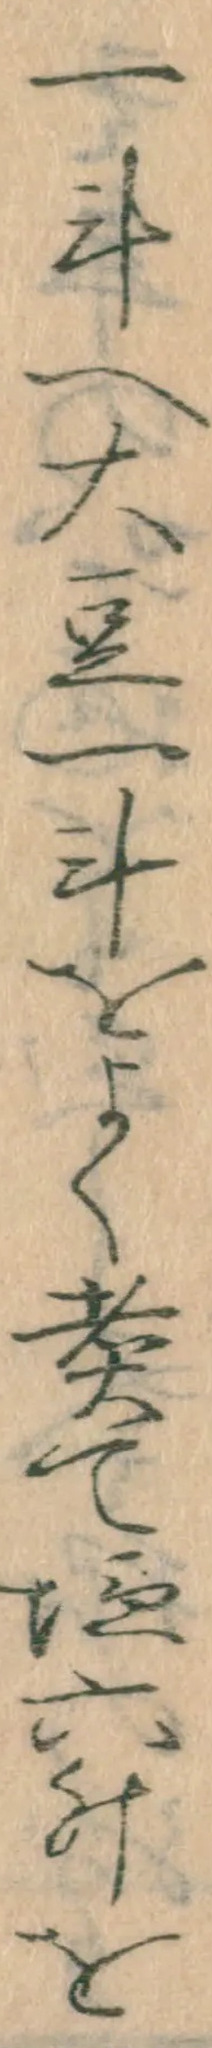一斗へ大豆一斗をよく煮て塩六升を
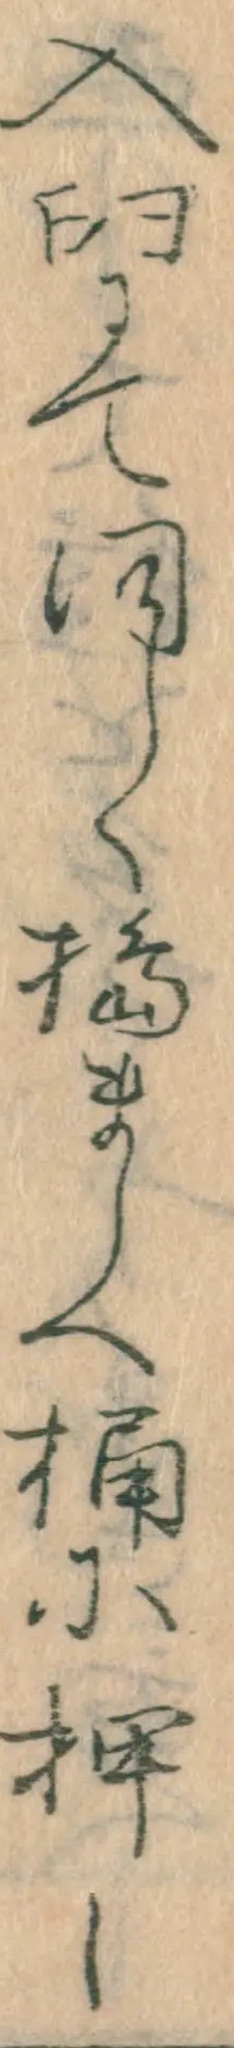入臼にて同しく搗ましへ桶に押し
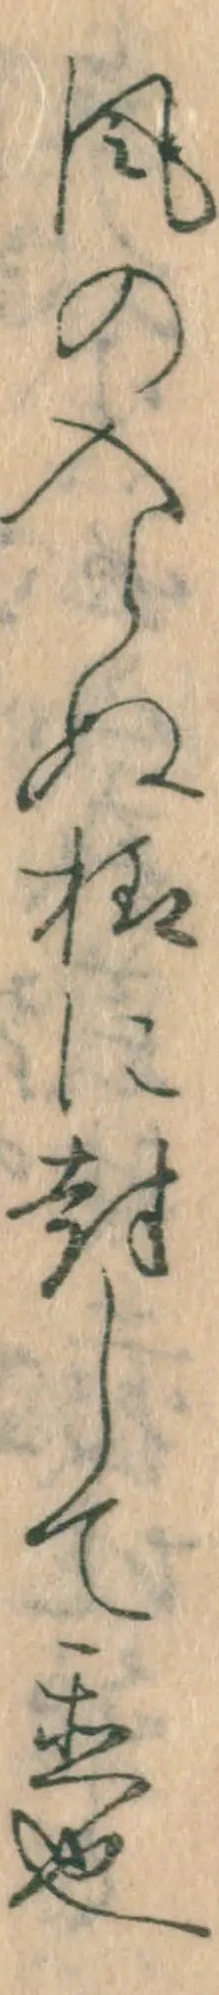風の入らぬ様に封して置也
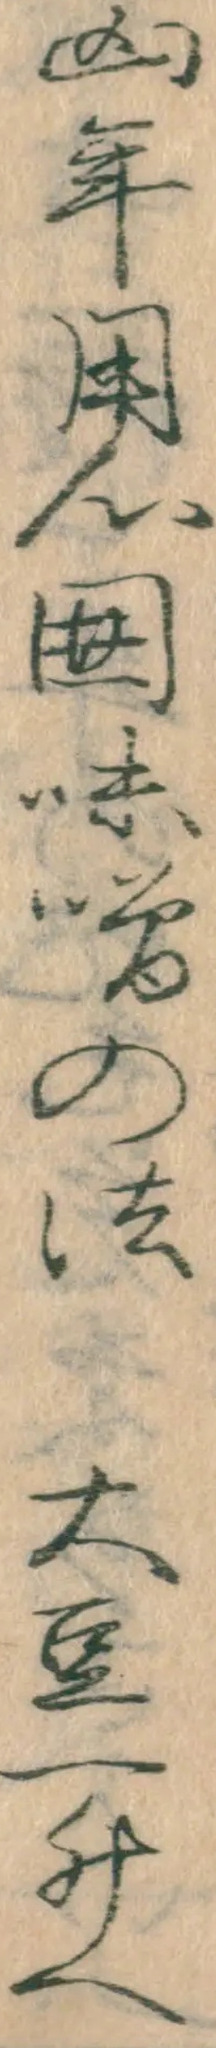凶年用心囲味噌の法大豆一升へ
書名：かてもの
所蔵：国立国会図書館 National Diet Library, JAPAN
